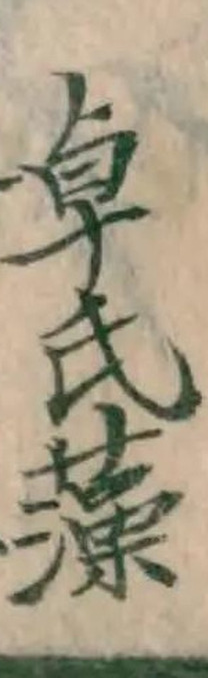卓氏藻
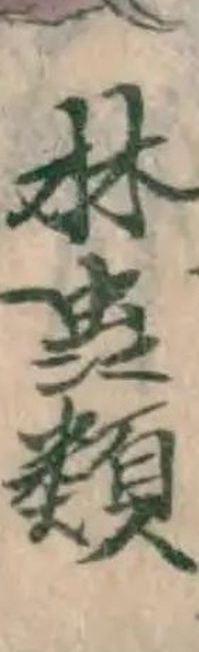林虫類
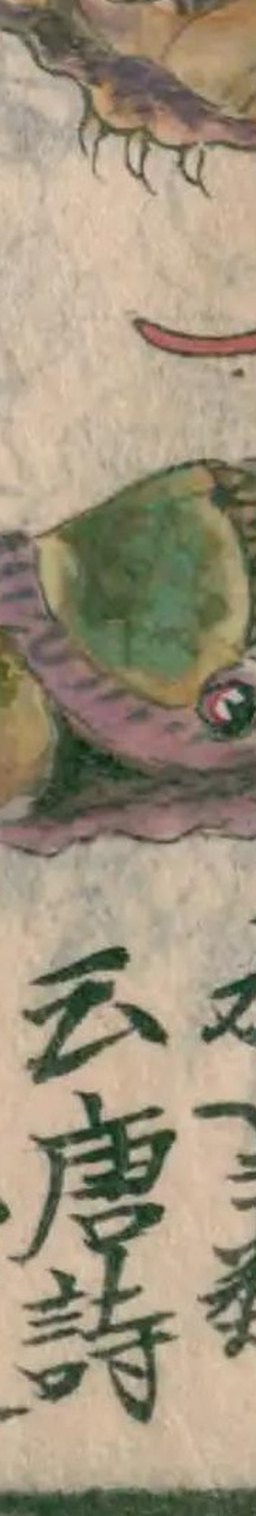云唐詩
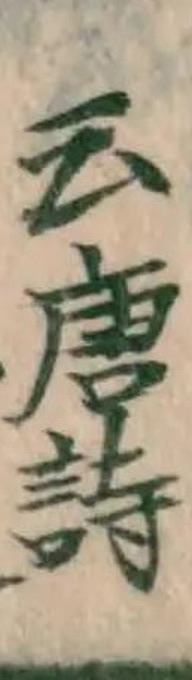云唐詩
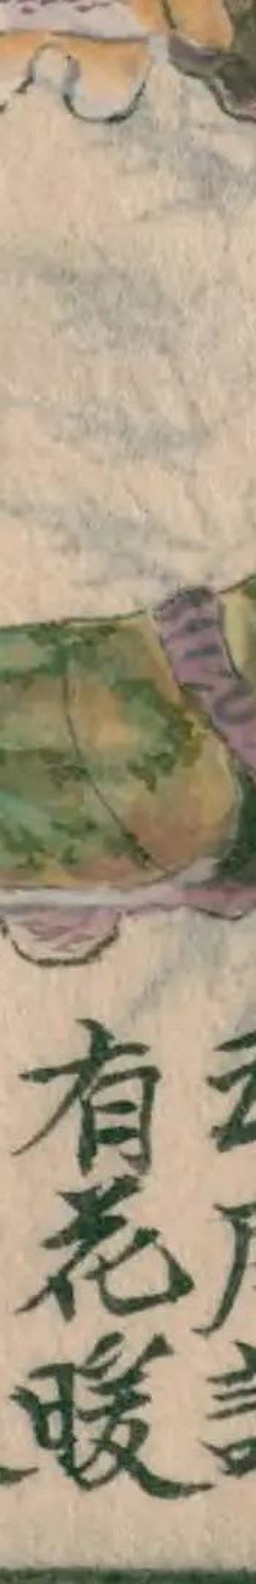有花暖
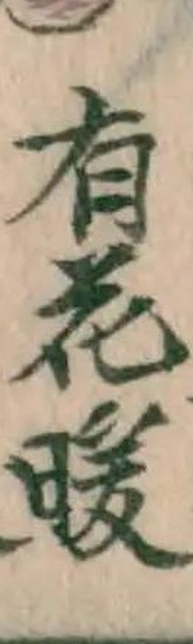有花暖
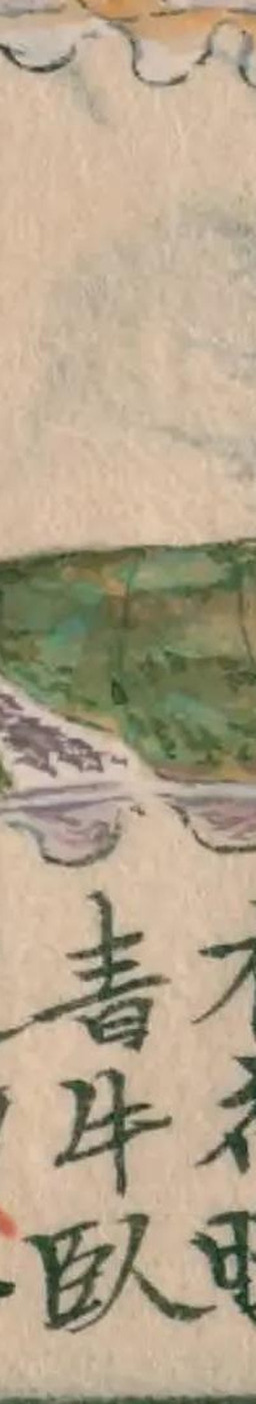青牛臥
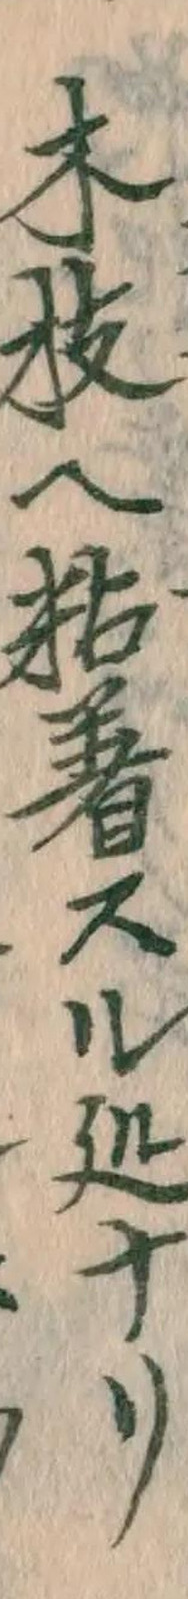木枝ヘ粘着スル処ナリ
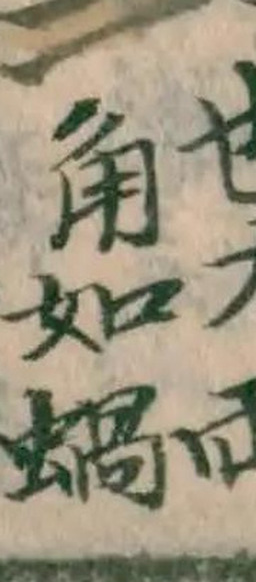角如蝸
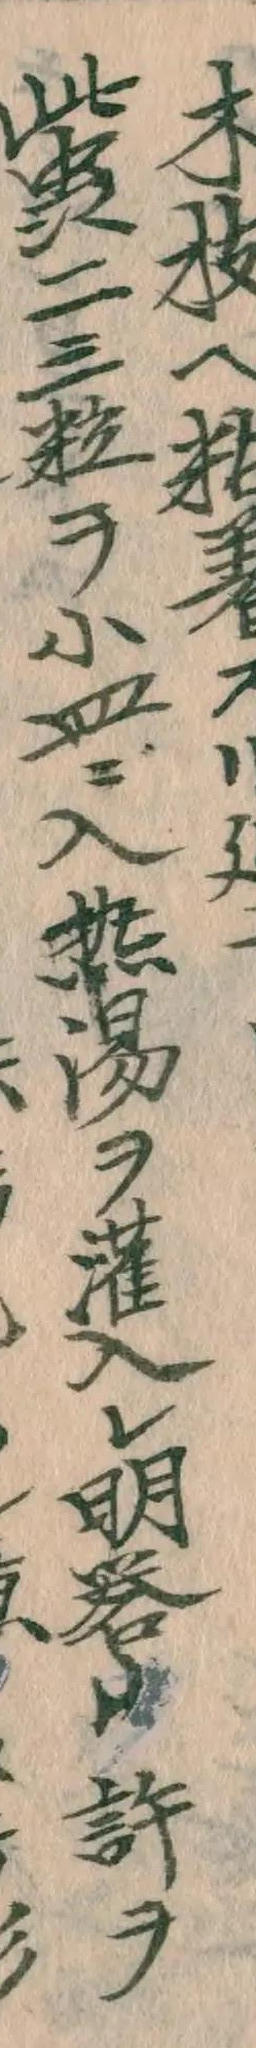此蟲二三粒ヲ小皿ニ入熱湯ヲ灌入レ明礬許ヲ
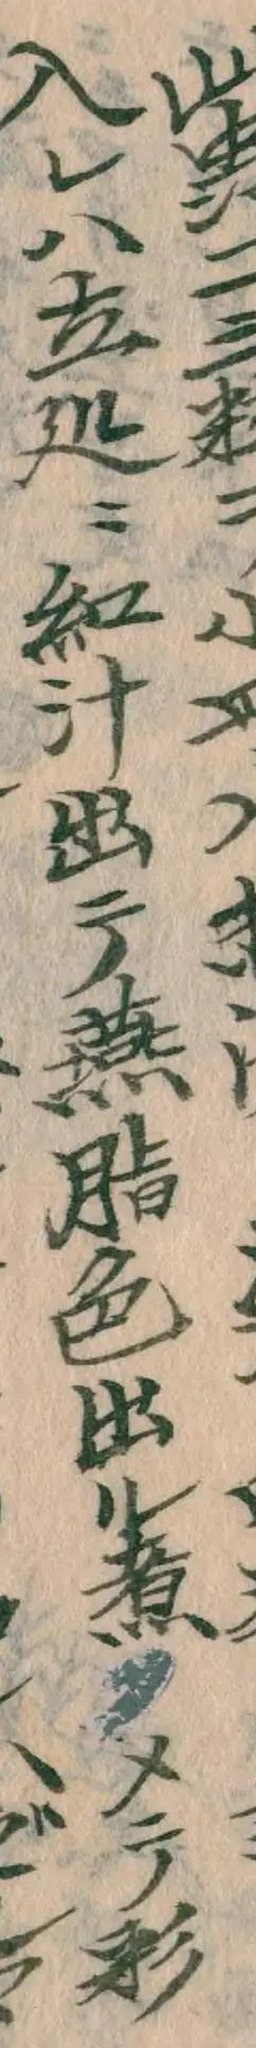入レハ立処ニ紅汁出テ燕脂色出ル煮メテ彩
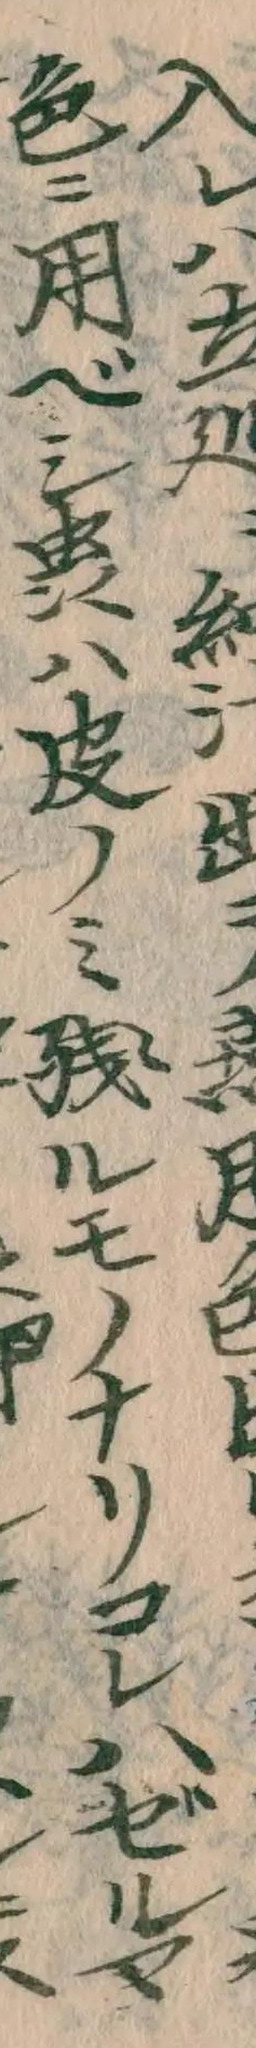色ニ用ベシ蟲ハ皮ノミ残ルモノナリコレハゼルマ
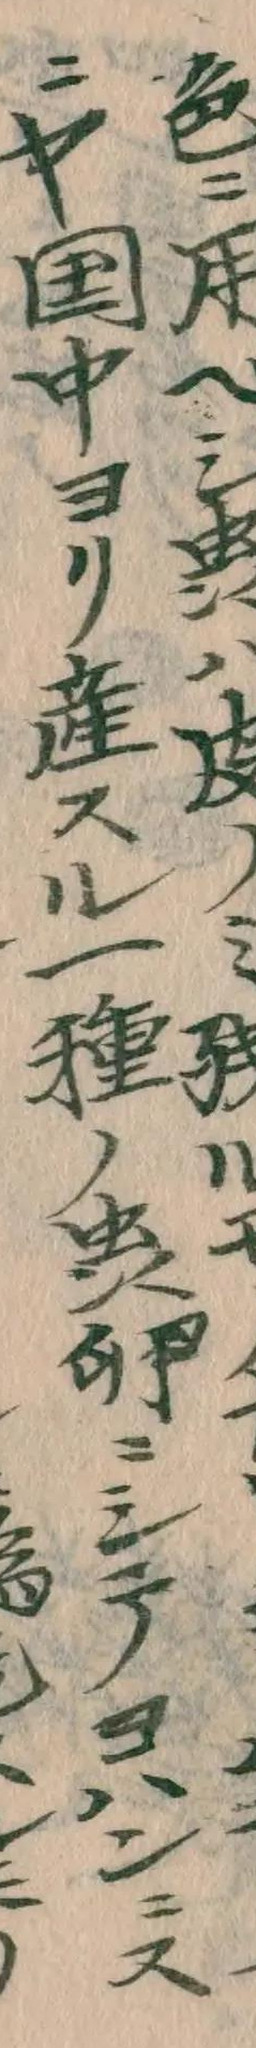ニヤ国中ヨリ産スル一種ノ蟲卵ニシテヨハンニス
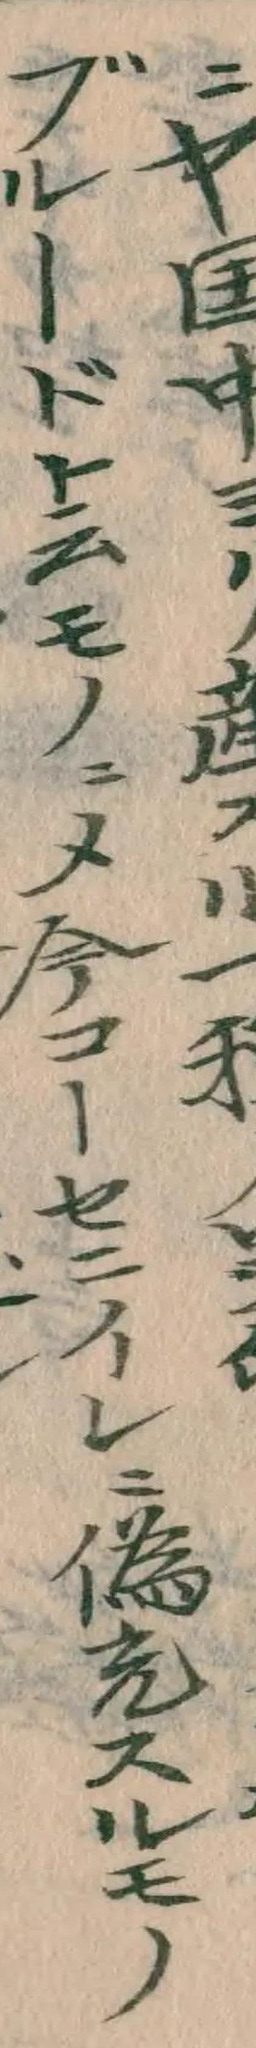ブルードト云モノニシテ今コーセニイレニ偽充スルモノ
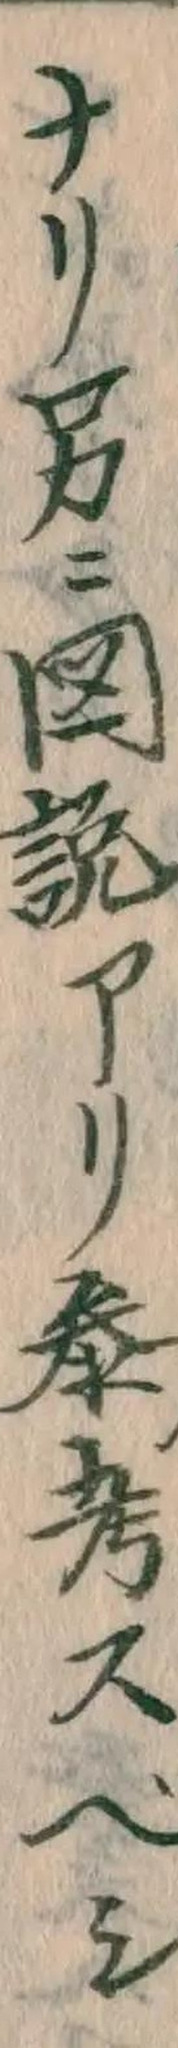ナリ另ニ図説アリ考スベシ
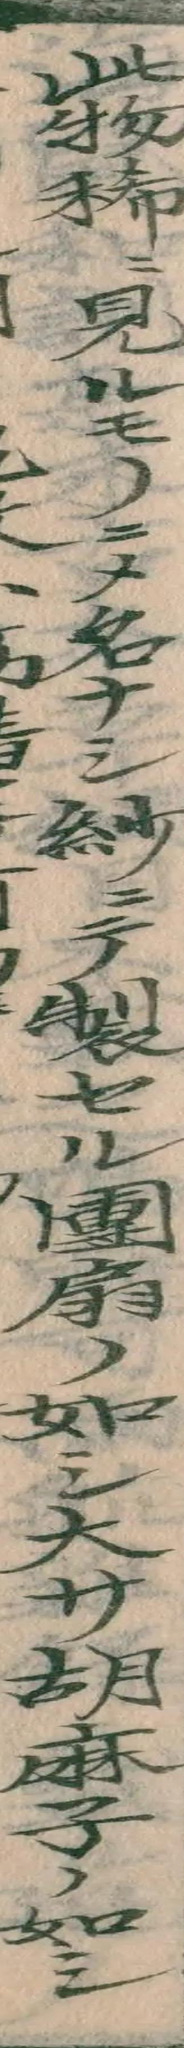此物稀ニ見ルモノニシテ名ナシ紗ニテ製セル団扇ノ如シ大サ胡麻子ノ如シ
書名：千蟲譜 3巻. [3]
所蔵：国立国会図書館 National Diet Library, JAPAN
